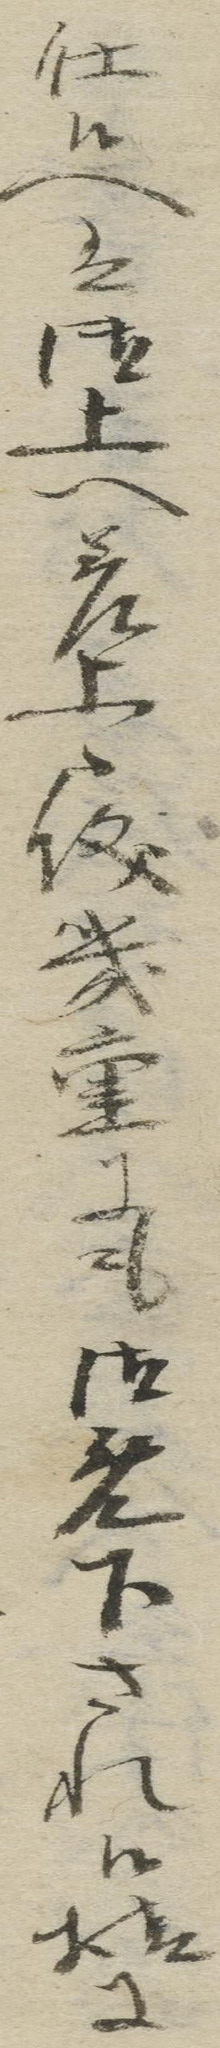仕候へは御上へ差上候儀幾重にも御免下され候様に
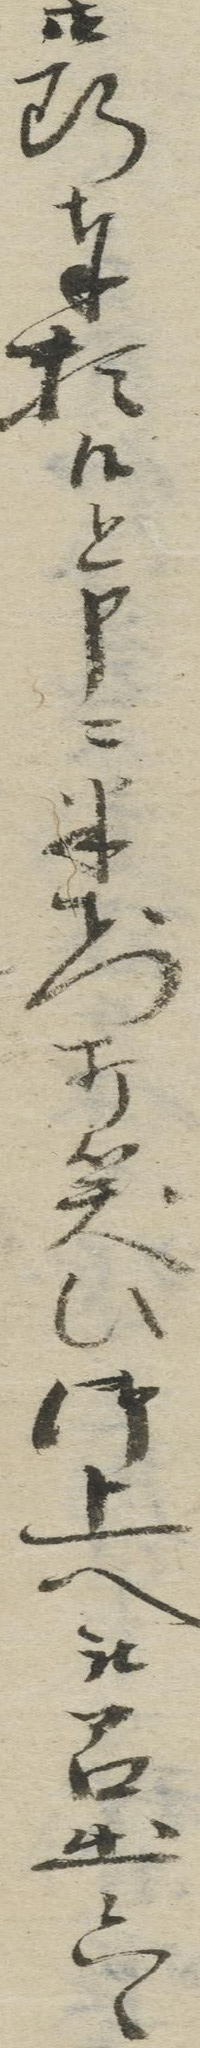御断奉頼候と申ニ半右衛門打笑ひ御上へ被召出候ハヽ
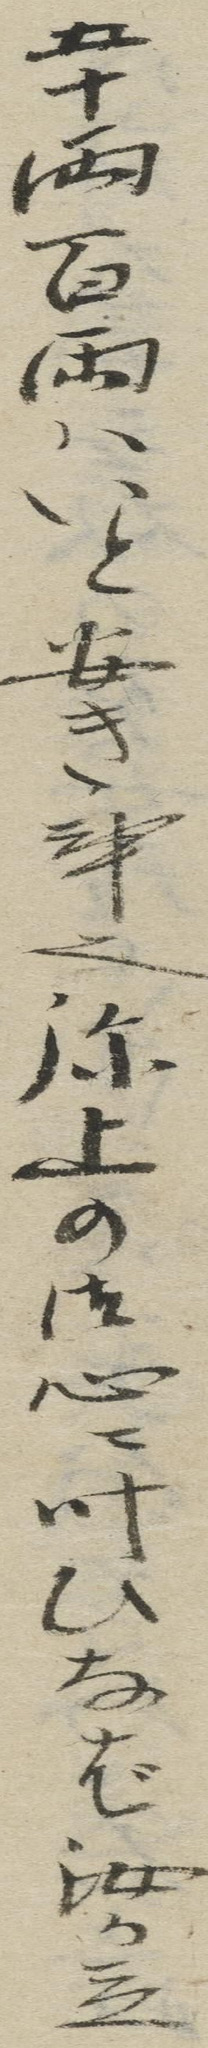五十両百両ハいと安き事也弥上の御心ニ叶ひなば汝か立
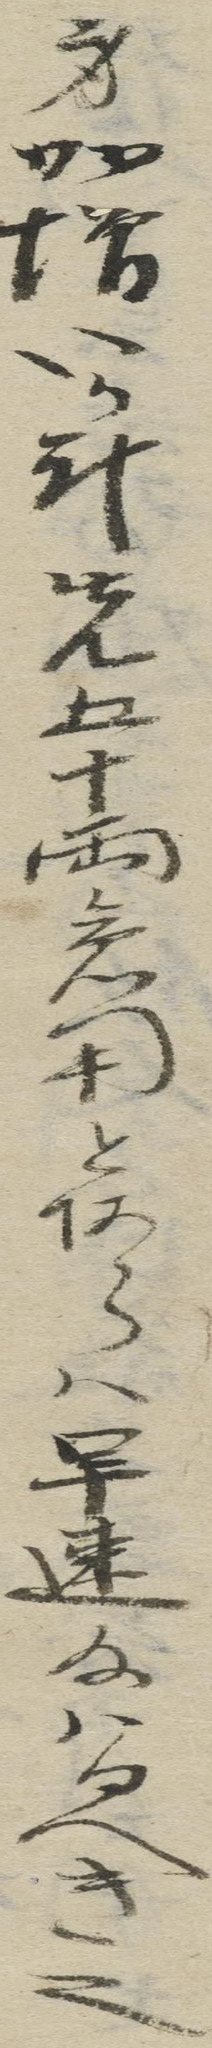身加増いか計先五十両急用とあらハ早速給はるへき也
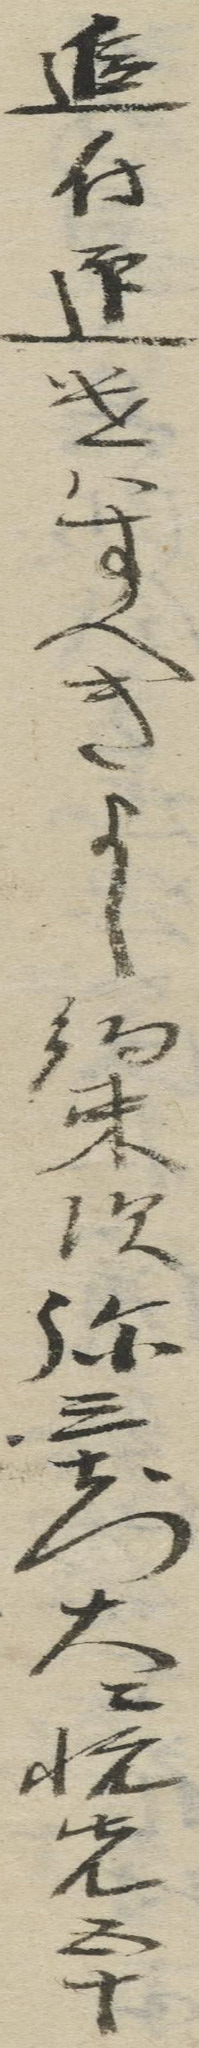追付仰遣ハすへきよし約束す弥三右衛門大ニ悦先五十
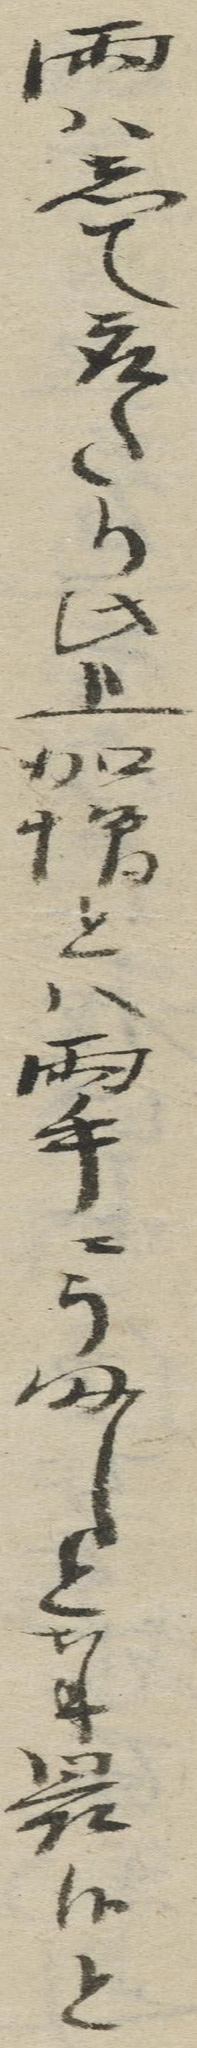両ハして取たり此上加増とハ両手ニうましと奉畏候と
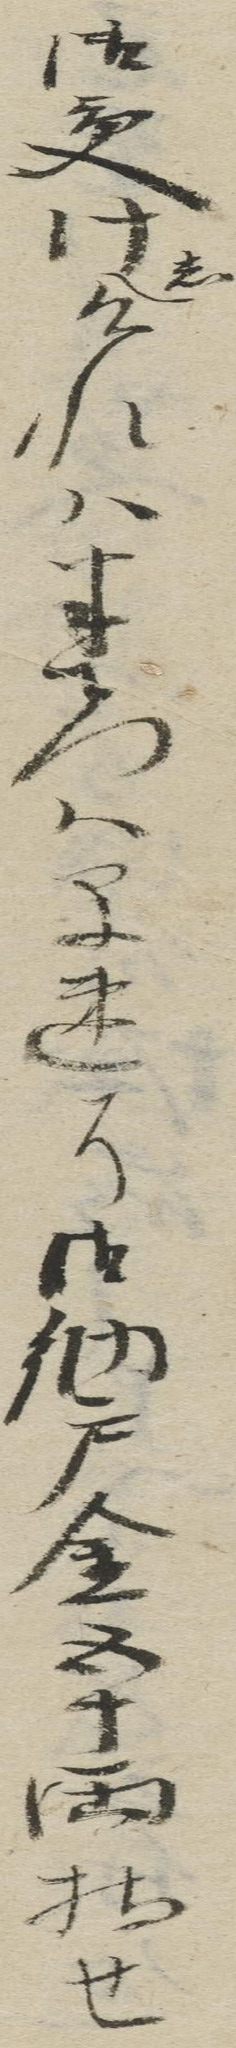御受けしけれハ半右衛門ハ早速に御納戸金五十両持せ
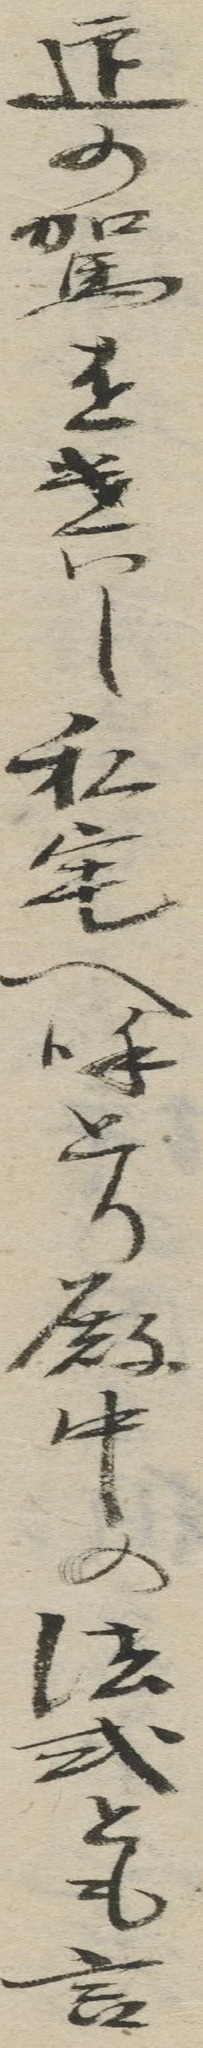仰の駕を遣ハし私宅へ呼とり殿中の儀式とも言
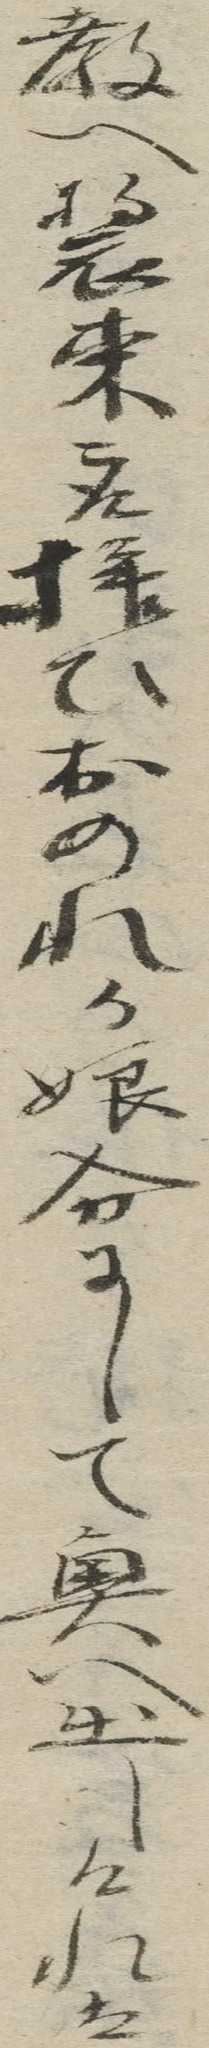教へ装束取繕ひおのれか娘分にして奥へ出しけれは
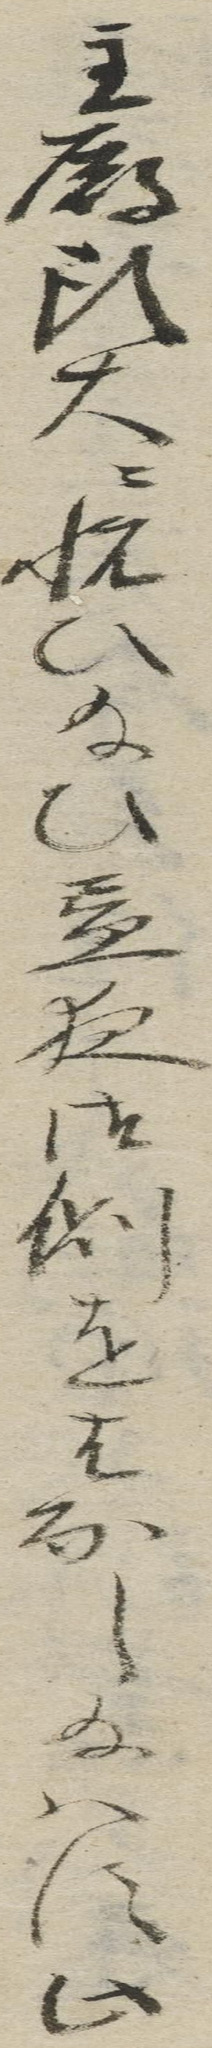主殿頭大ニ悦ひ給ひ昼夜御側をはなし給ハす此
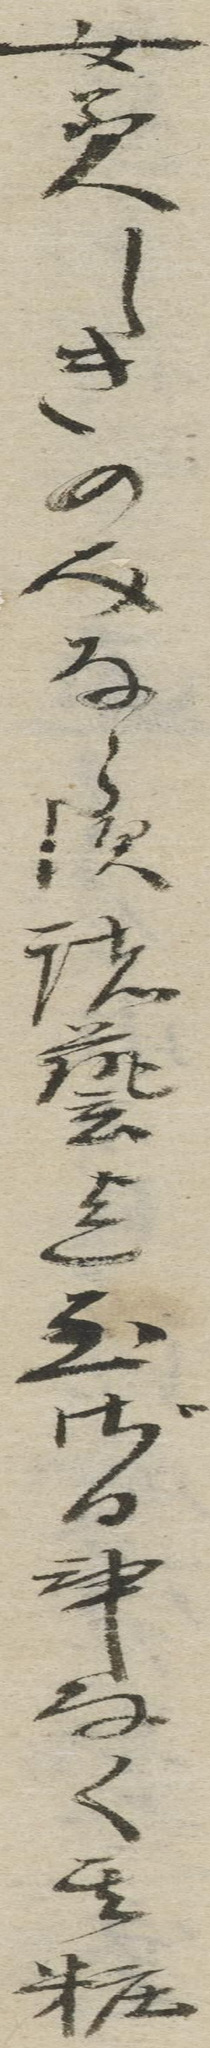女美しきのみならす諸芸迄至ざる事なく其粧
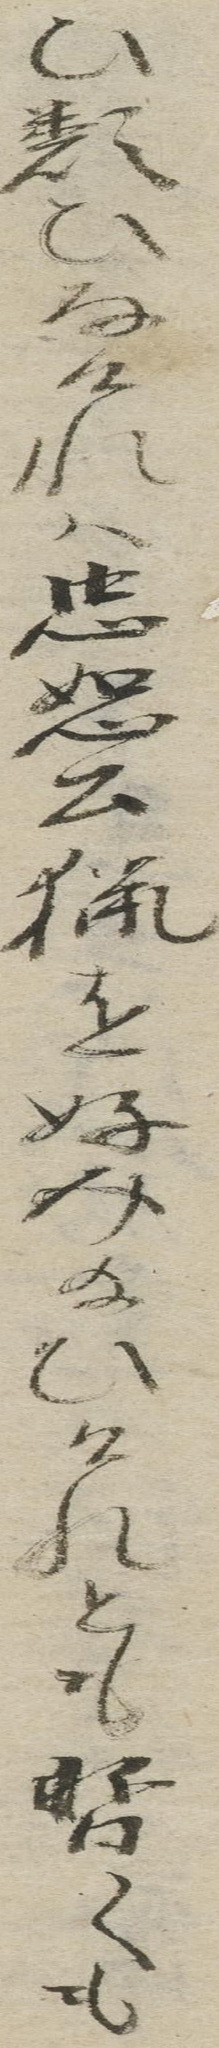ひ類ひなけれハ忠恕公猟を好み給ひけれとも暫くも
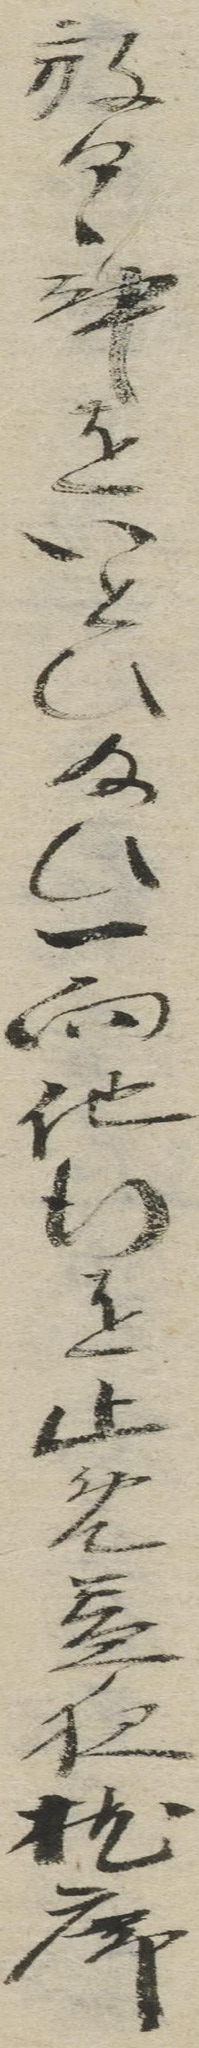放るゝ事をいとひ給ひ一向他行を止め昼夜枕席
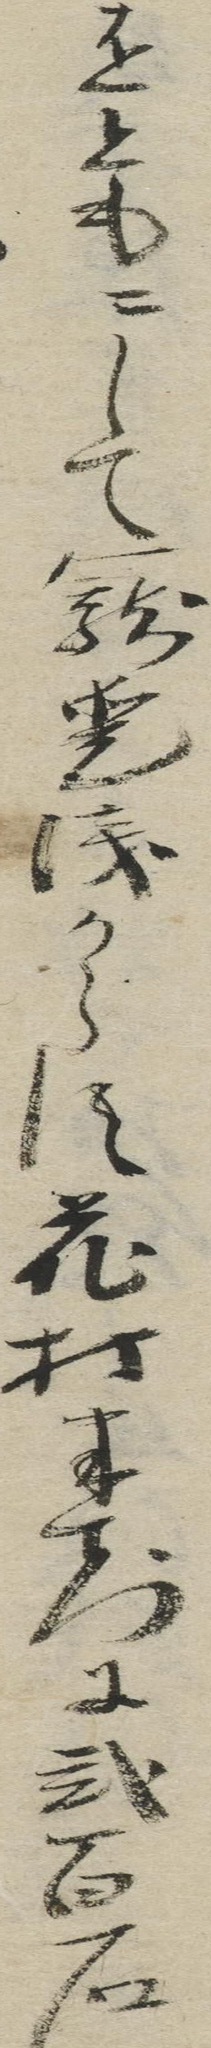をともニして寵愛浅からす花村半右衛門に弐百石
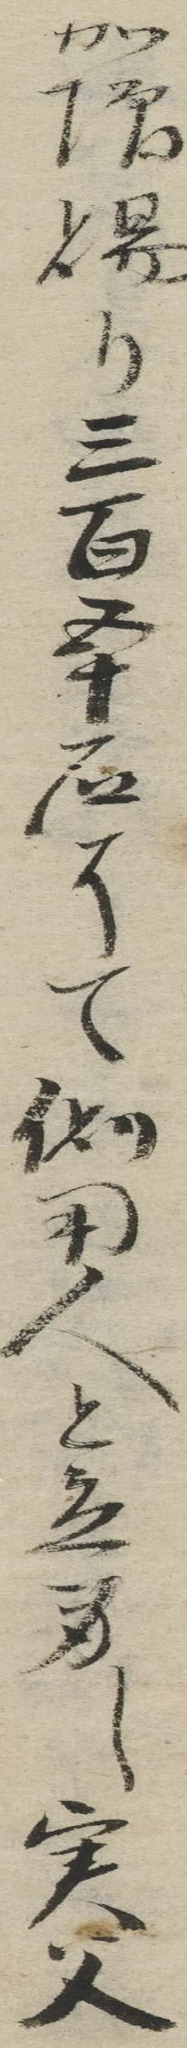加増賜り三百五十石にて側用人と立身し実父
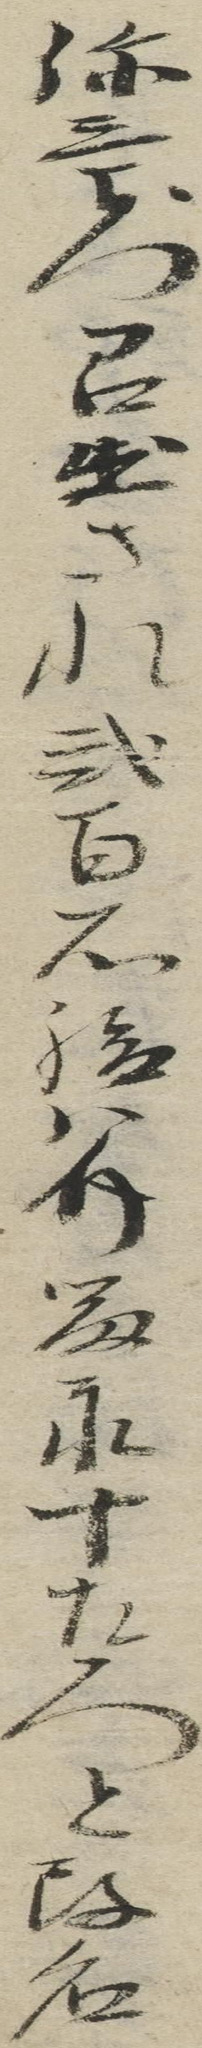弥三右衛門召出され弐百石後ハ介富永十左衛門と改名
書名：肥前國島原領普賢山大変記　完
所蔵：東京大学地震研究所図書室 Earthquake Research Institute Library, The University of Tokyo, JAPAN
